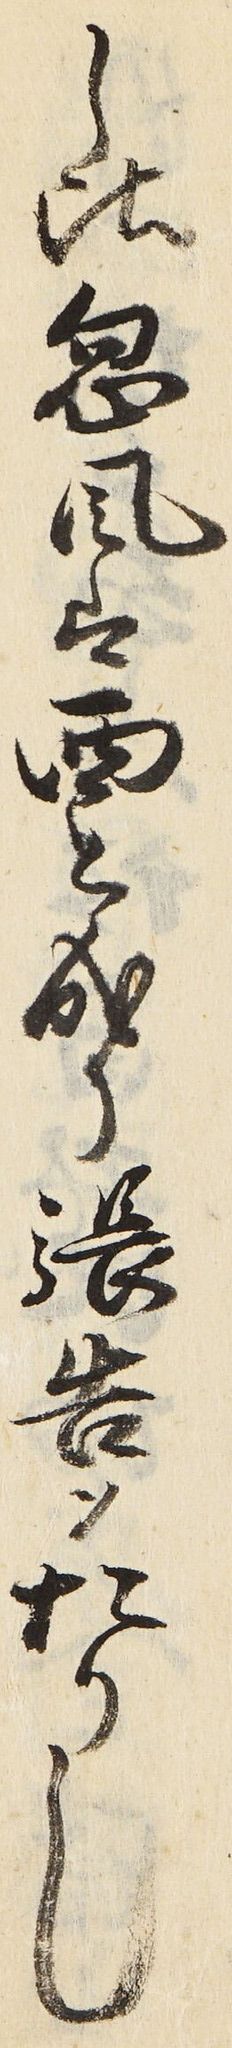し比忽風は西と成り張告めたりし
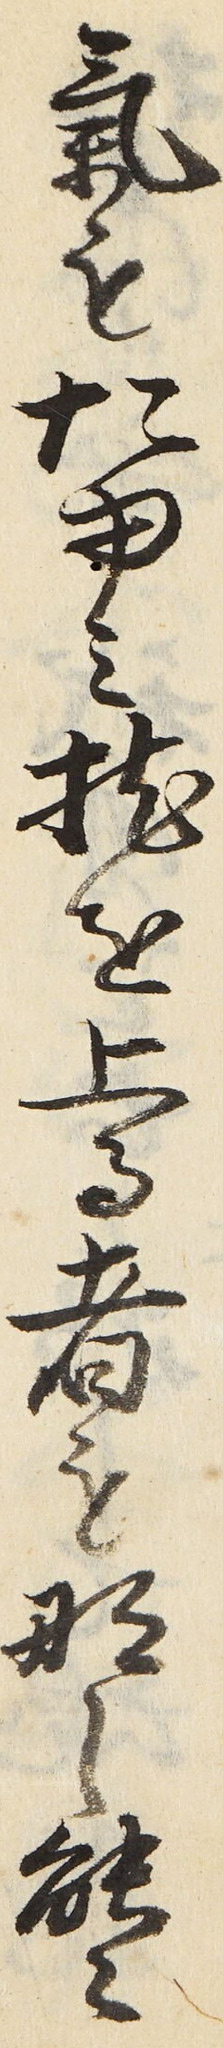気もたゆみ扶を上る者もなし能々
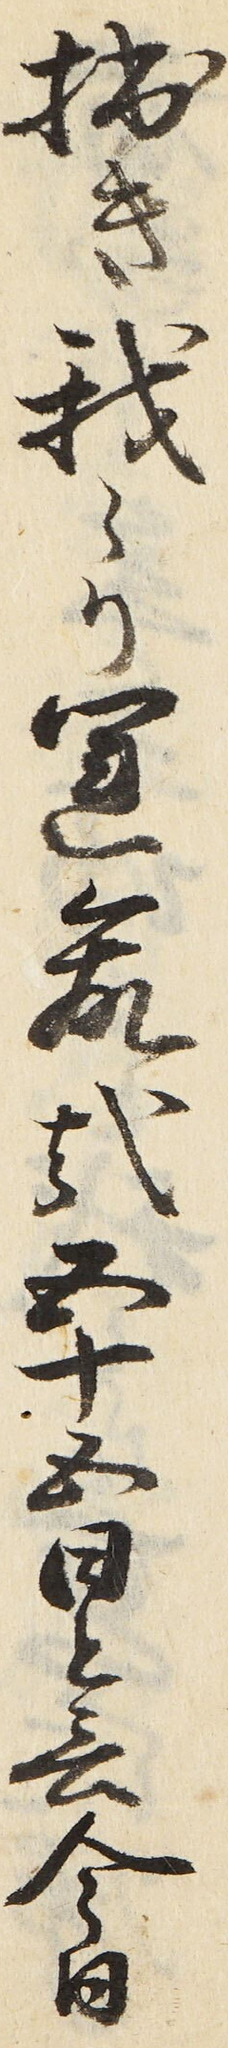拙き我々か運流哉五十五日と云今日
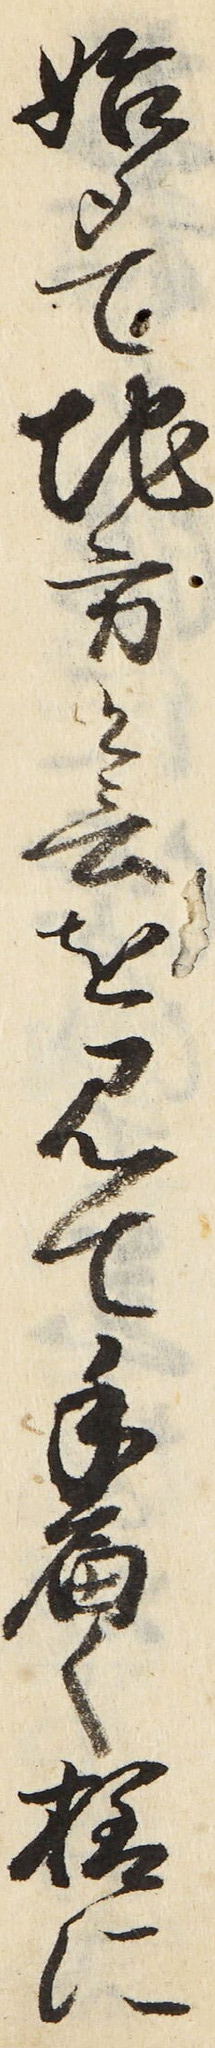始めて地方の言を見て手届く様に
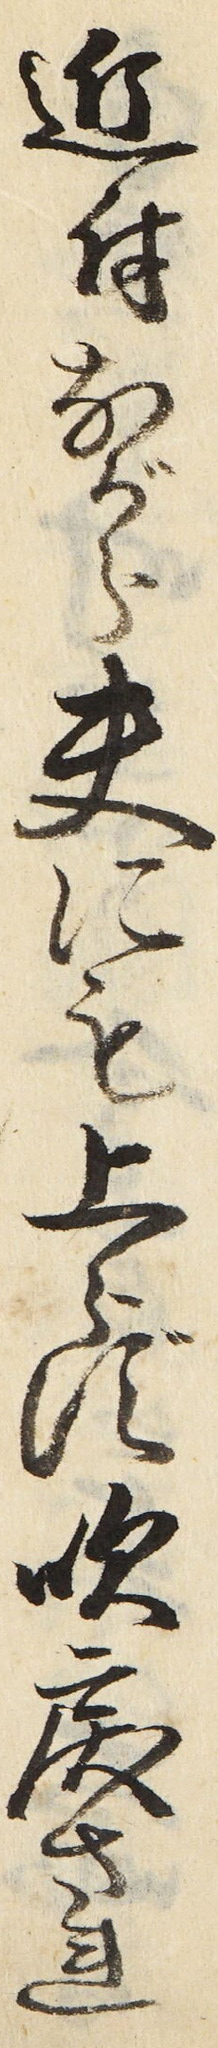近付ながら夫にも上らず吹戻され
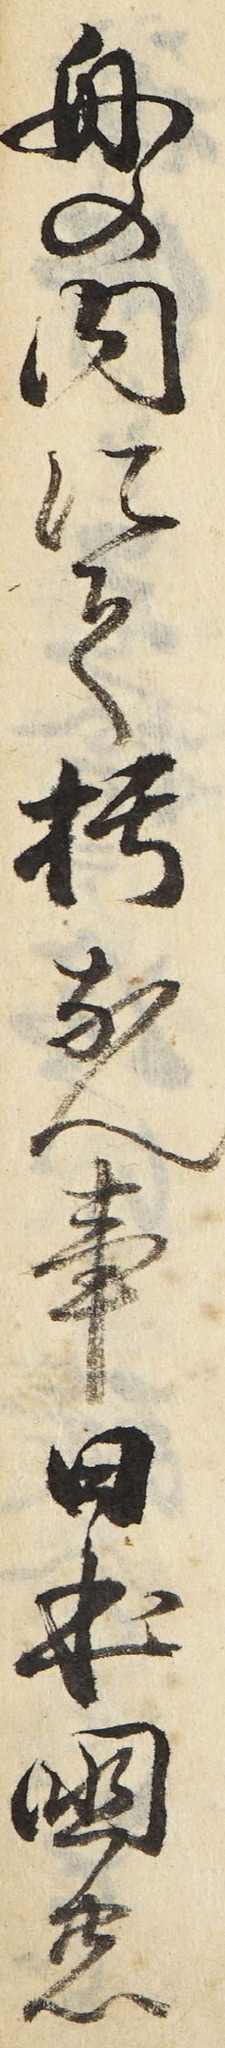舟の内にて朽なん事日本国の

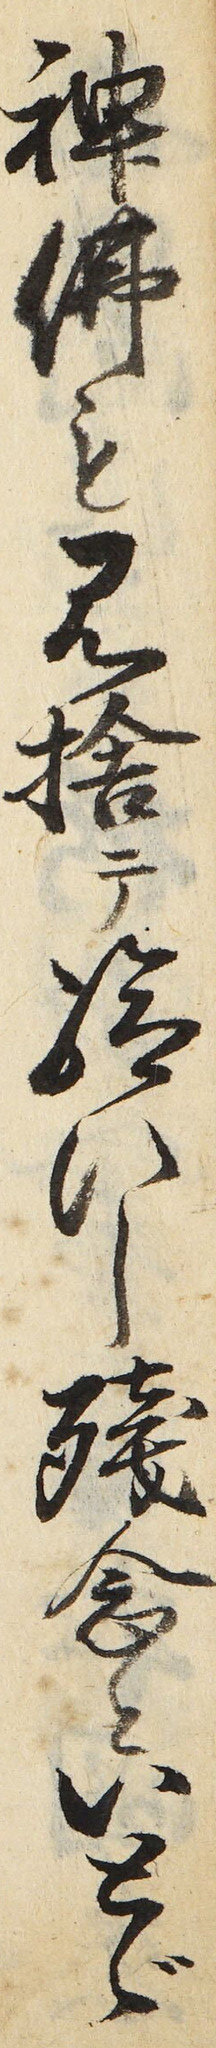神仏も見捨て給ひし残念といとゞ
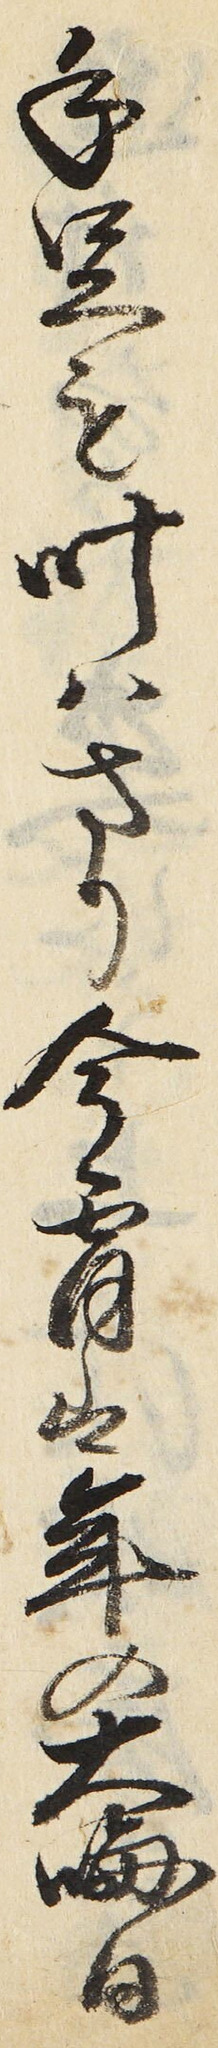手足も叶はさり今宵は年の大晦日
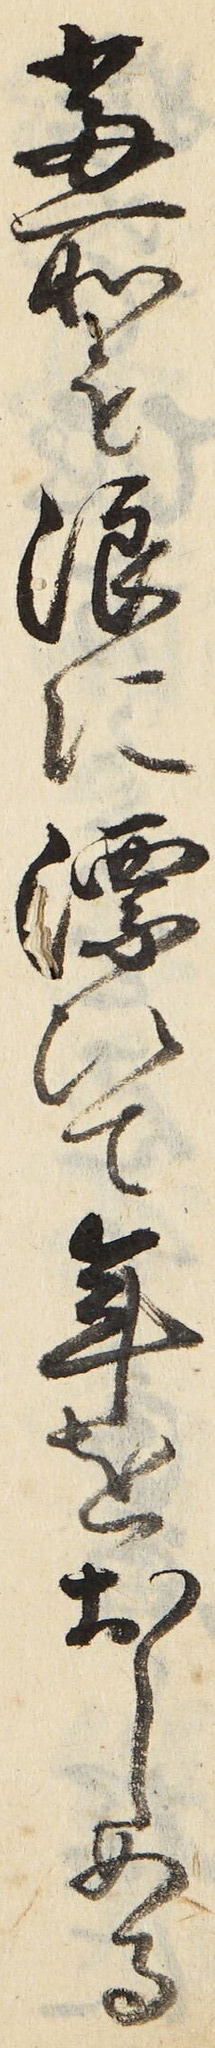当所も浪に漂ひて年をおしめる
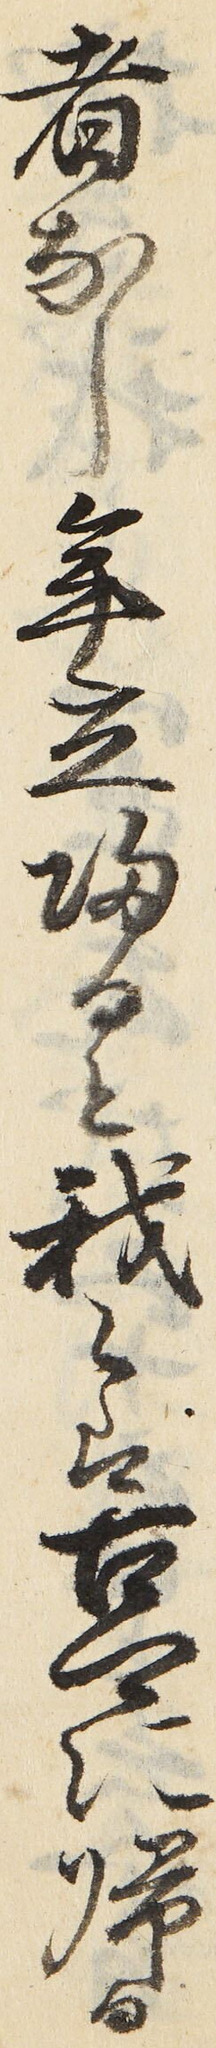者なし年立帰ると我々は古郷に帰る
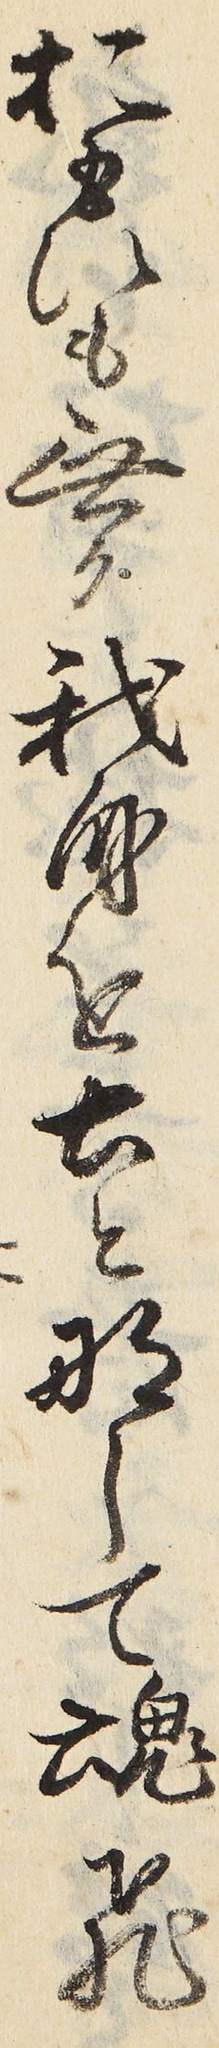おもいも無く我身を土となして魂飛
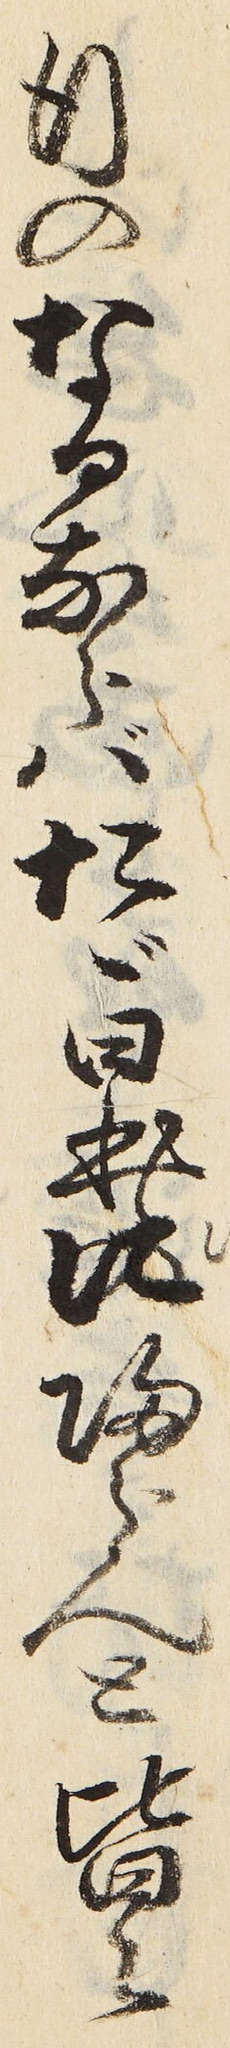行のなるならばたゞ日本に帰らんと皆々
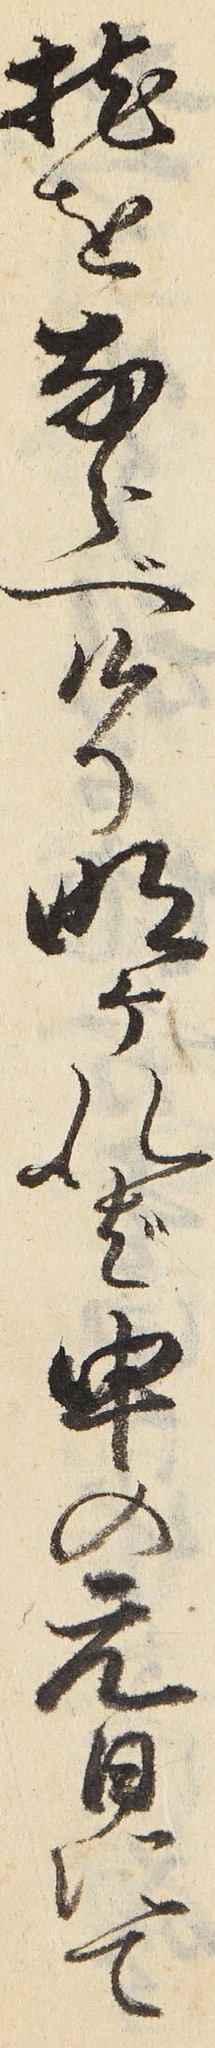扶をならべけり明ければ申の元旦にて
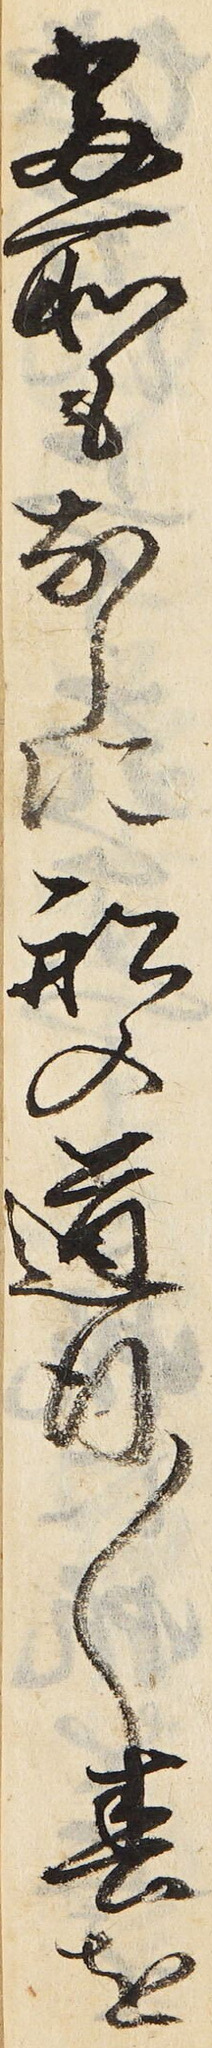当所もなしに船の道行〳〵春を
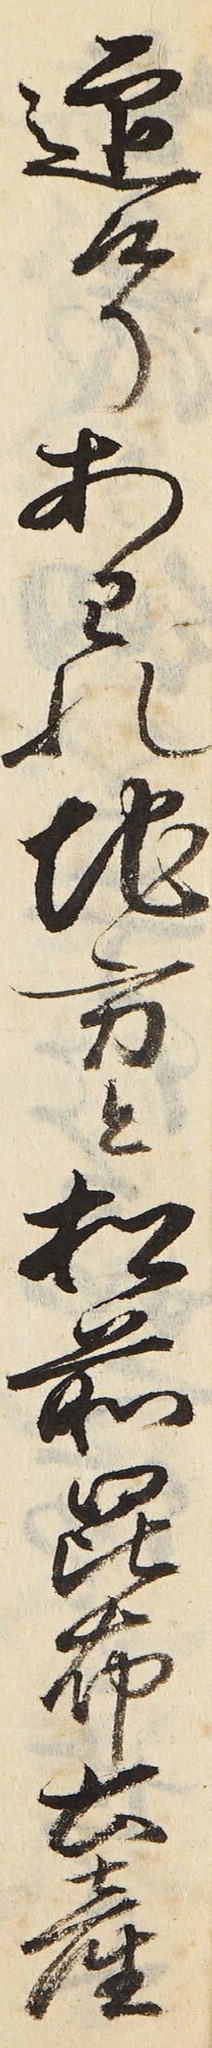迎けりあわれ地方と松前昆布土産
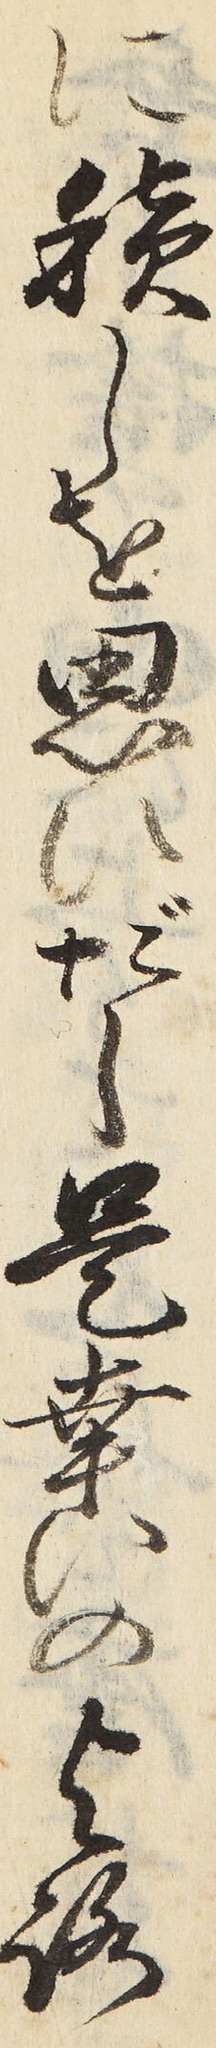に積しを思ひだし是幸ひのよろ
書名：華夷九年録
